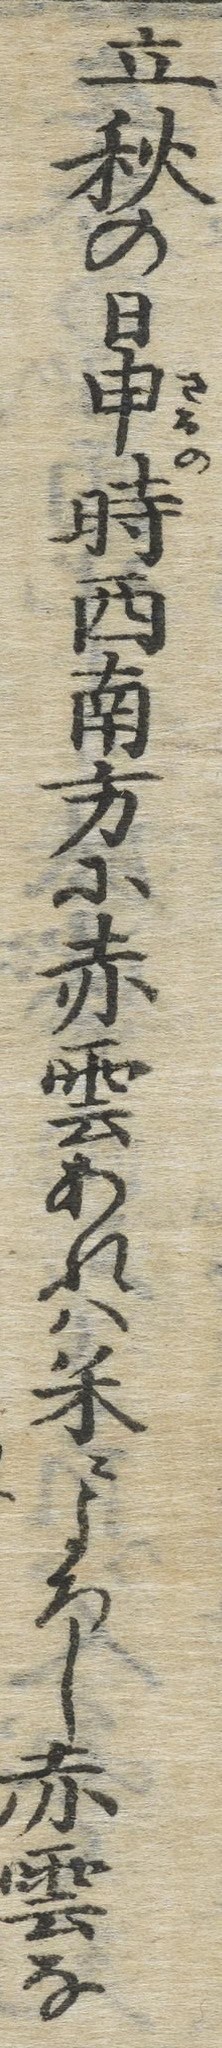立秋の日申時西南方に赤雲あれは米ニよろし赤雲な
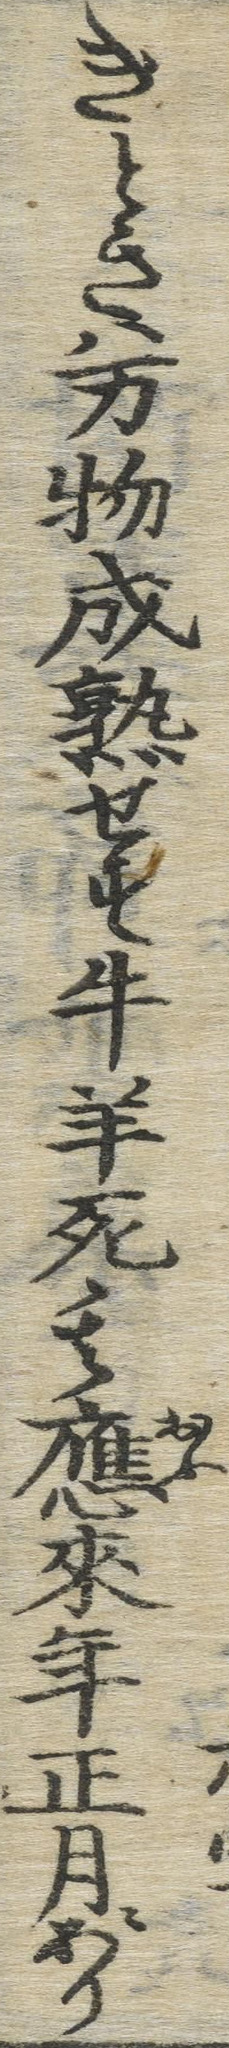きときは万物成熟せす牛羊死其應来年正月ニあり
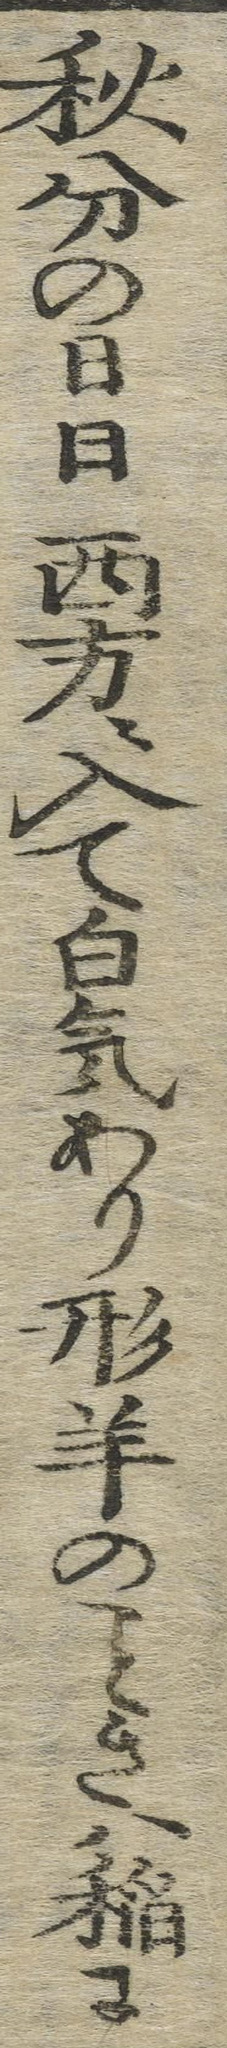秋分の日日西方ニ入て白気あり形羊のこときは稲に
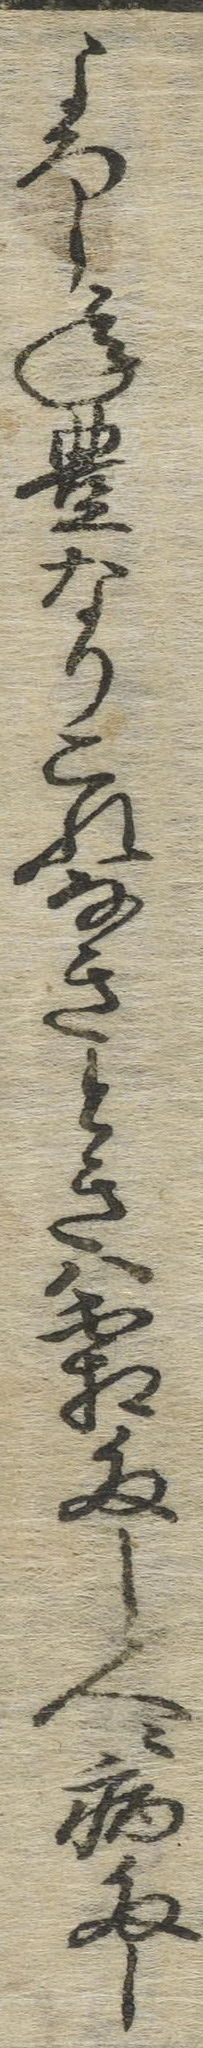よろし年豊なりこれなきときは霜多し人ニ病多し
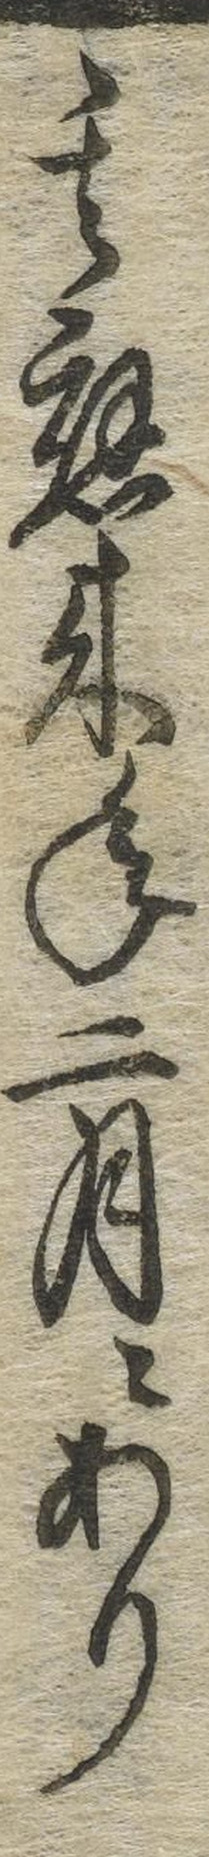其応来年二月ニあり
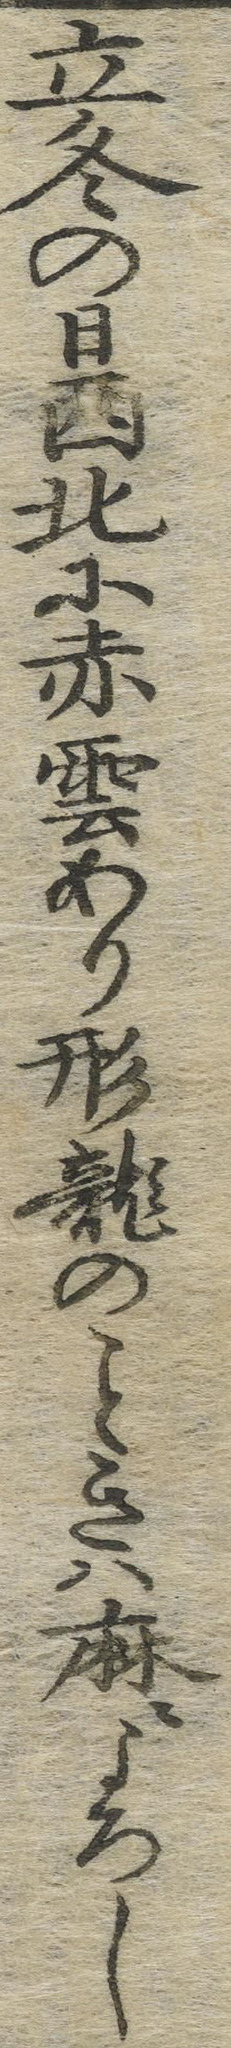立冬の日西北に赤雲あり形龍のこときは麻ニよろし
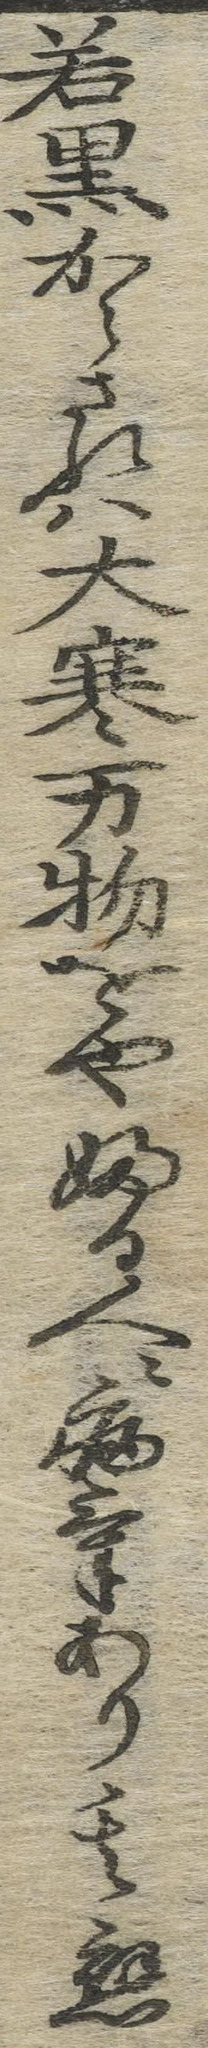若黒からされは大寒万物をやふる人ニ病気あり其応
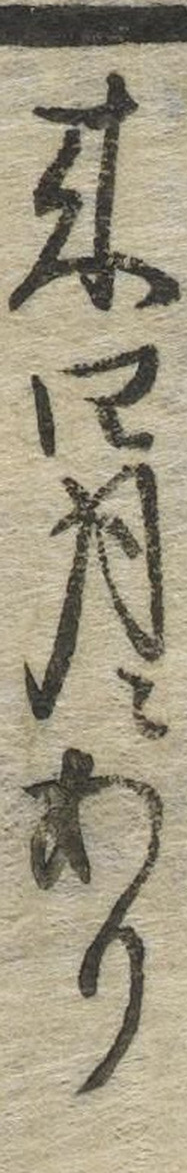来四月ニあり
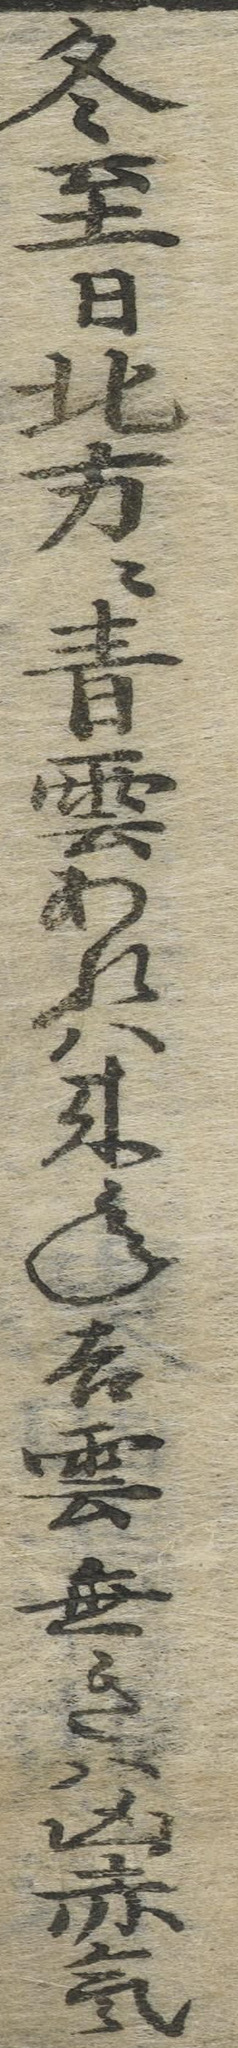冬至日北方ニ青雲あれは来年吉雲無きは凶赤気
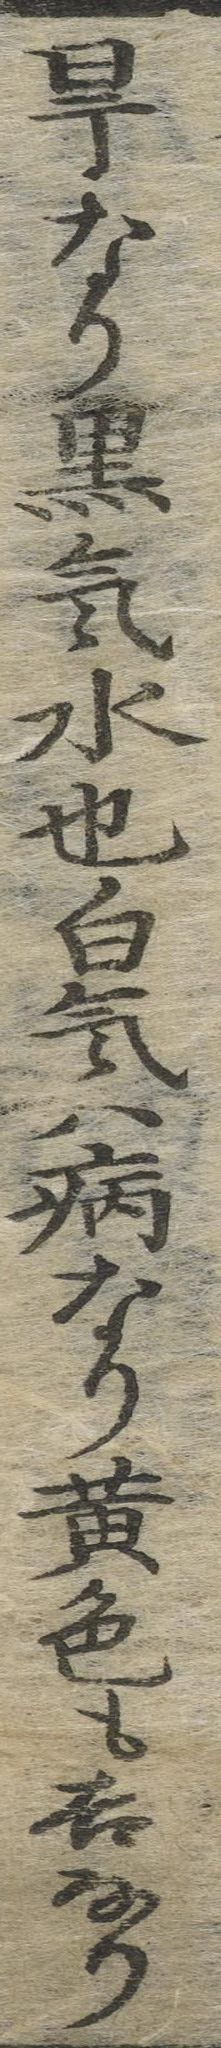旱なり黒気水也白気は病なり黄色も吉なり
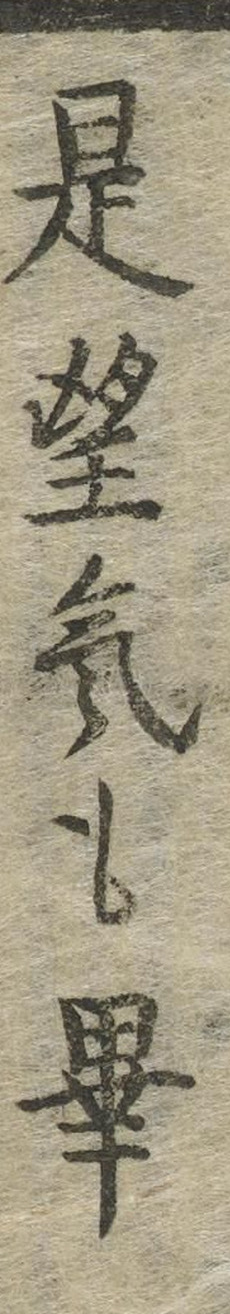是望気も畢

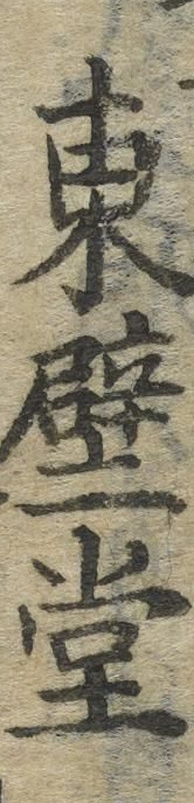東壁堂
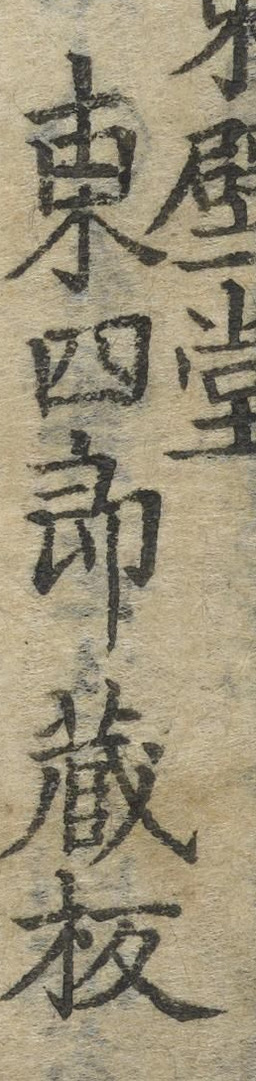東四郎蔵板
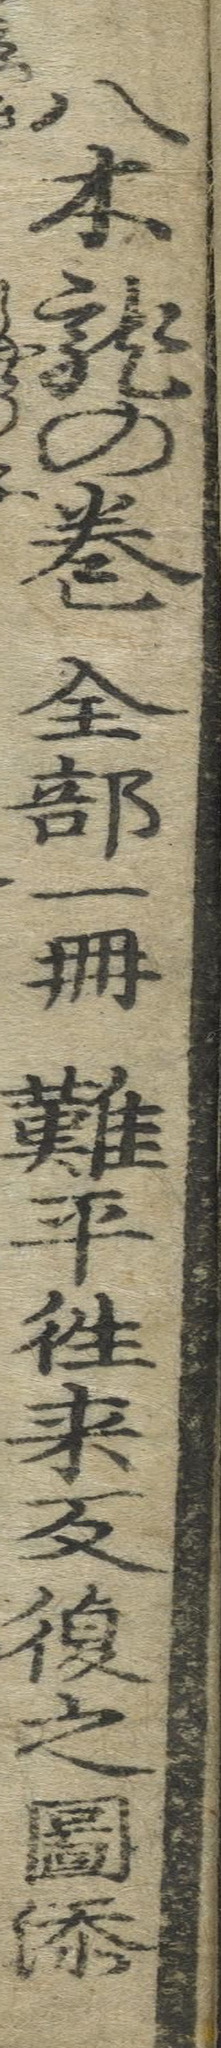八木龍の巻全部一冊難平往来反復之図添
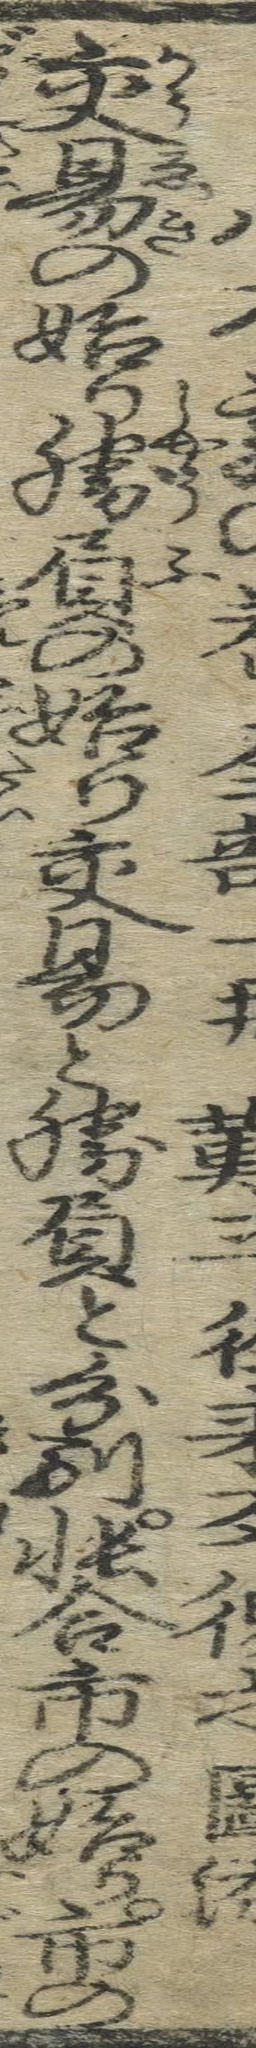交易の始り勝負の始り交易と勝負と分別。帳合市の始り。市の
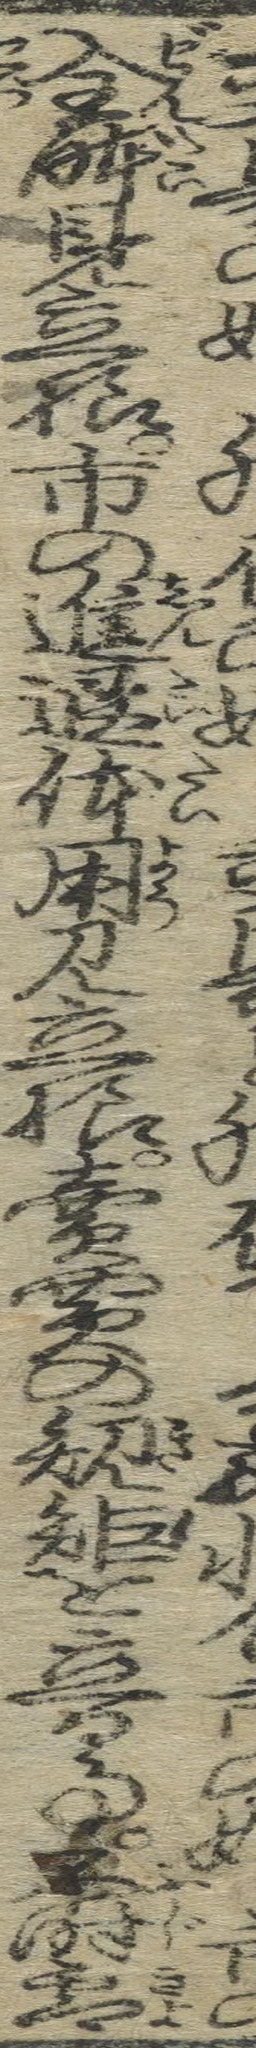全体見立様。市の進退体用見立様。売買の規矩を立る事。不時虚
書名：[晴雨考]
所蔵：東京大学地震研究所図書室 Earthquake Research Institute Library, The University of Tokyo, JAPAN
